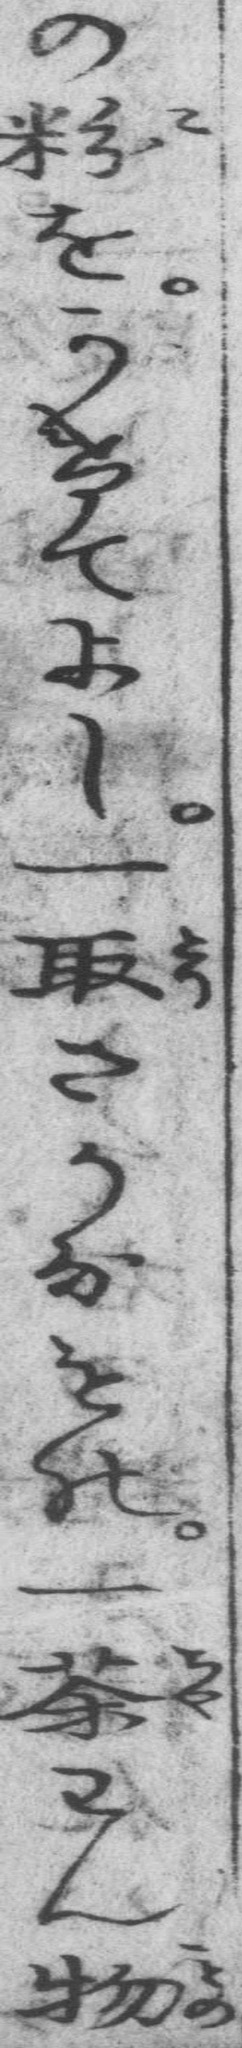の粉を。かけてよし。一取さかなもの。一茶わん物

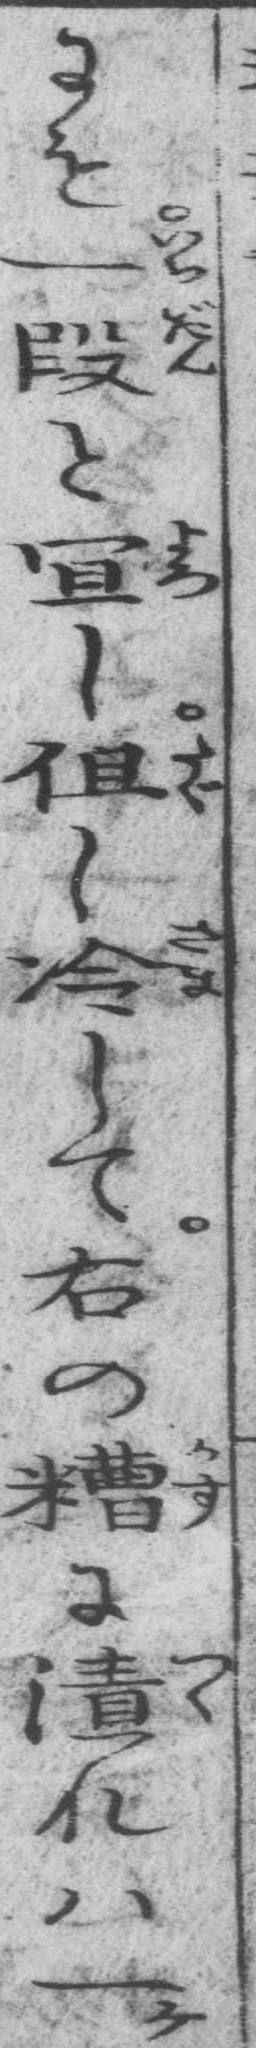にも。一段と宜し。但し冷して。右の糟に漬れは一ヶ
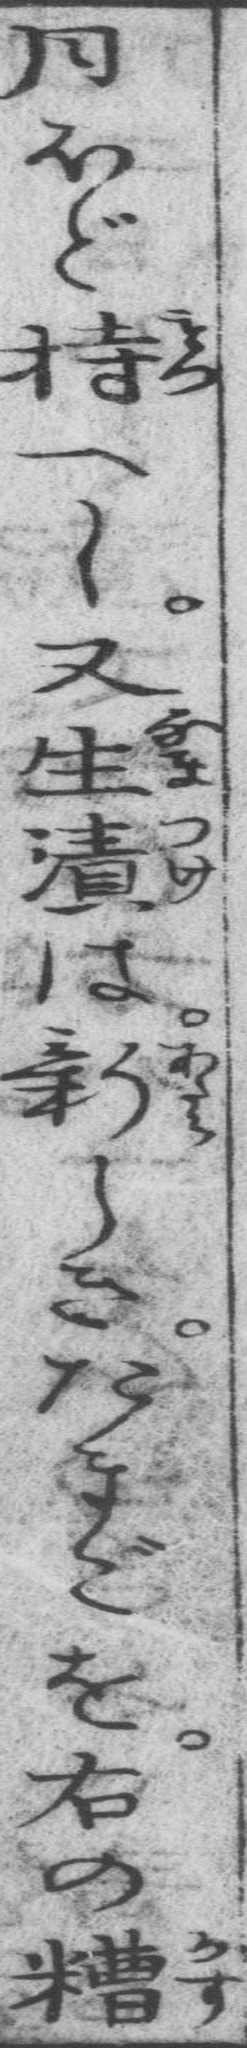月ほど持へし。又生漬は。新しき。たまごを。右の糟
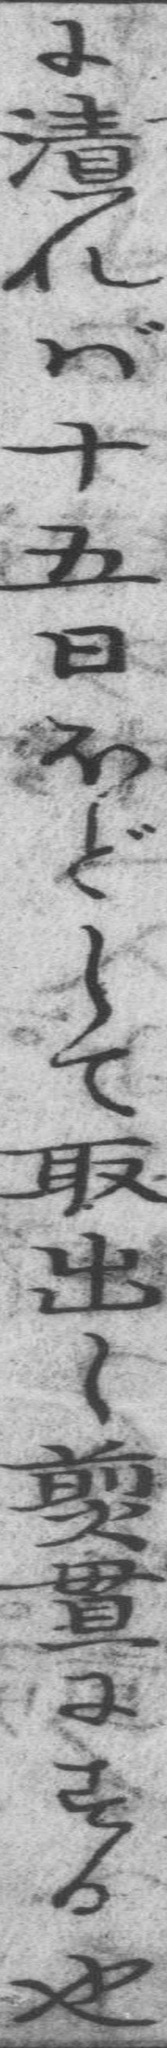に漬れば。十五日ほどして。取出し。煎貫にする也。
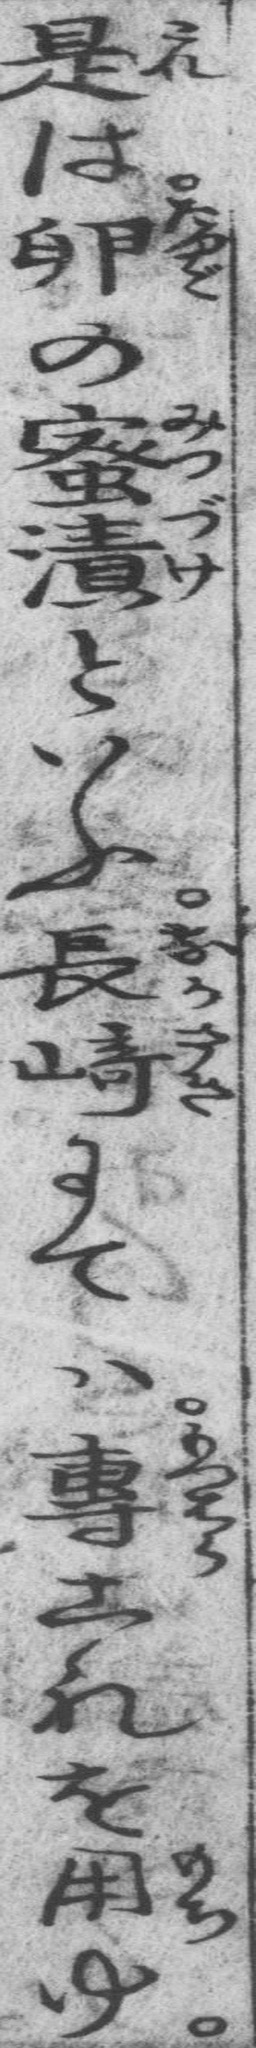是は。卵の蜜漬といふ。長崎にては。専これを用ゆ。
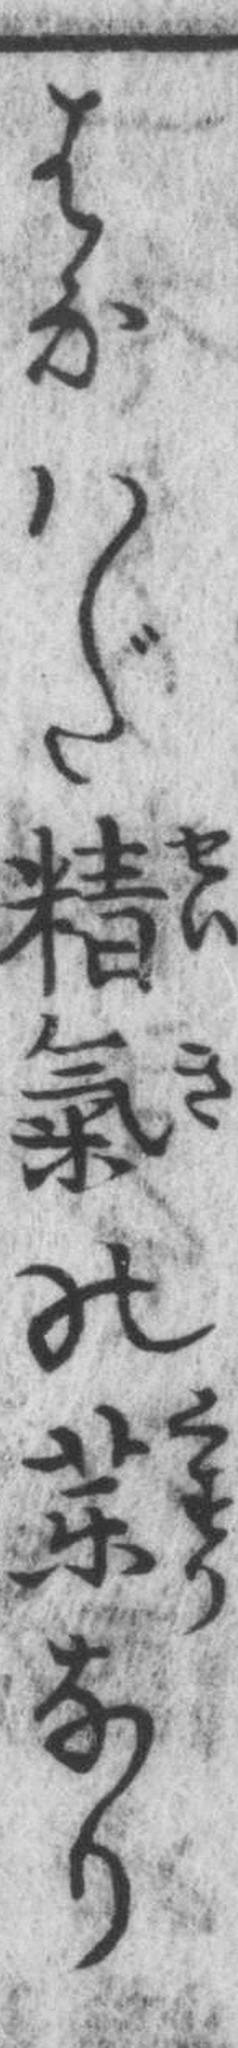はなはだ精気の薬なり
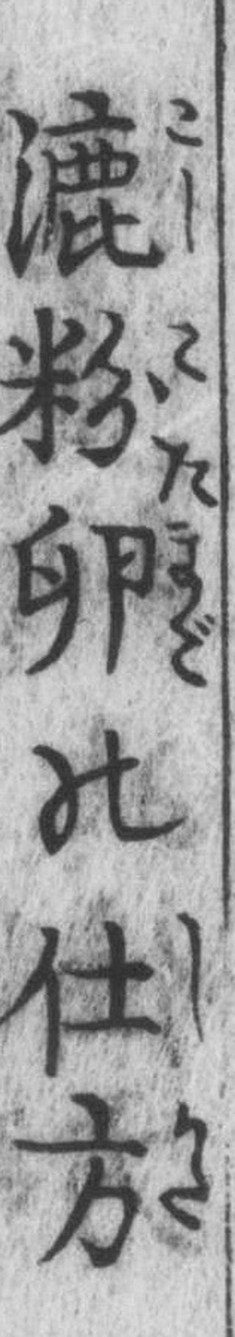漉粉卵の仕方
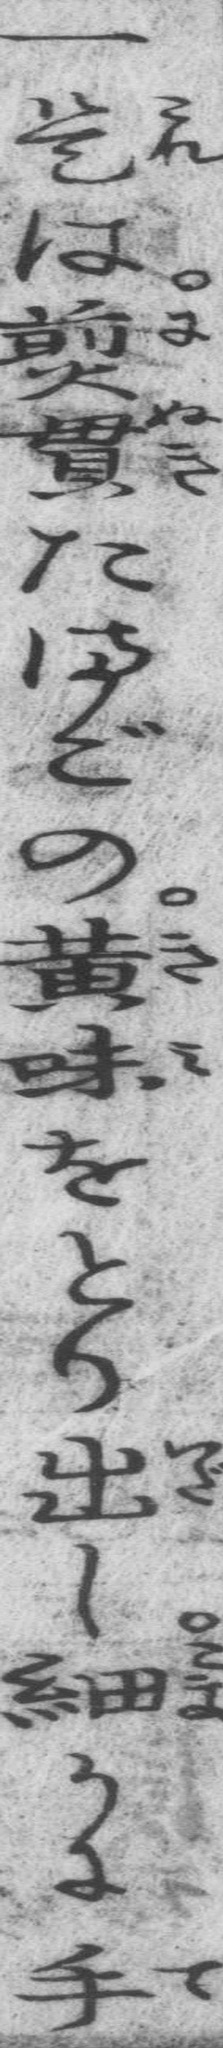一是は。煎貫たまごの。黄味をとり出し。細かに手
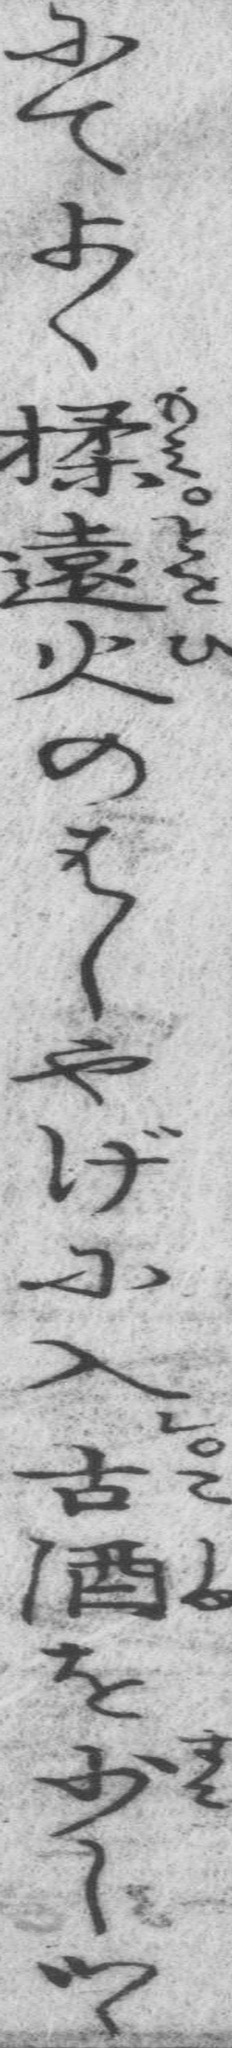にてよく揉。遠火のはしやげに入れ。古酒を少しつゝ
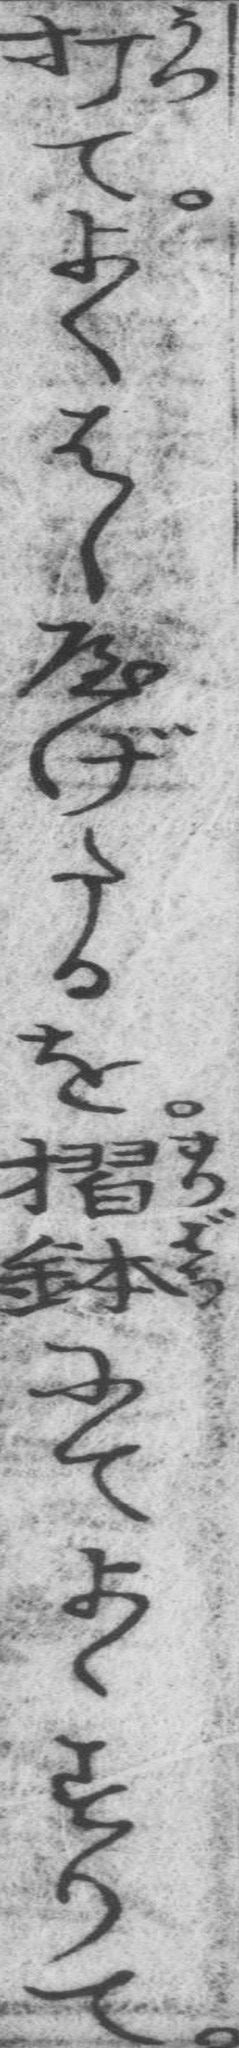打て。よくはしやげたるを。摺鉢にてよくすりて。
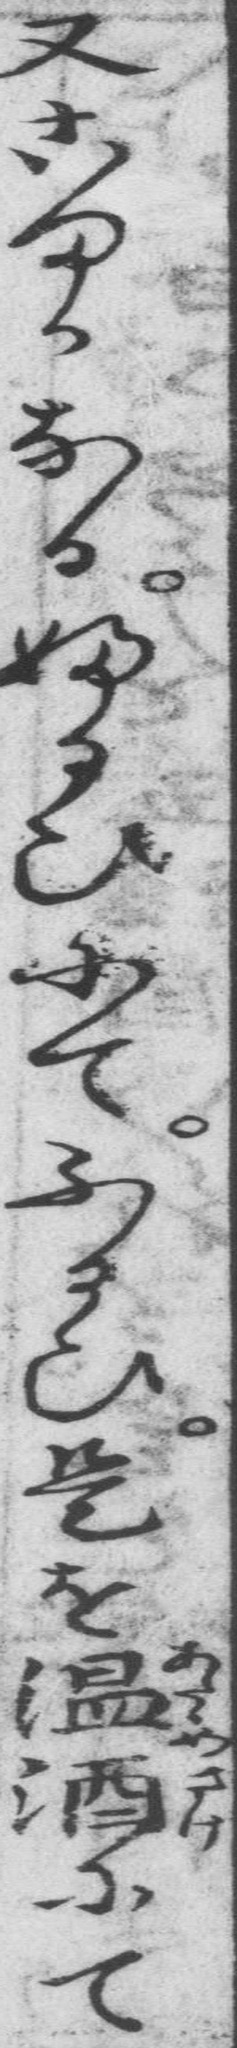又こまかなる。ふるひにて。ふるひ。是を温酒にて
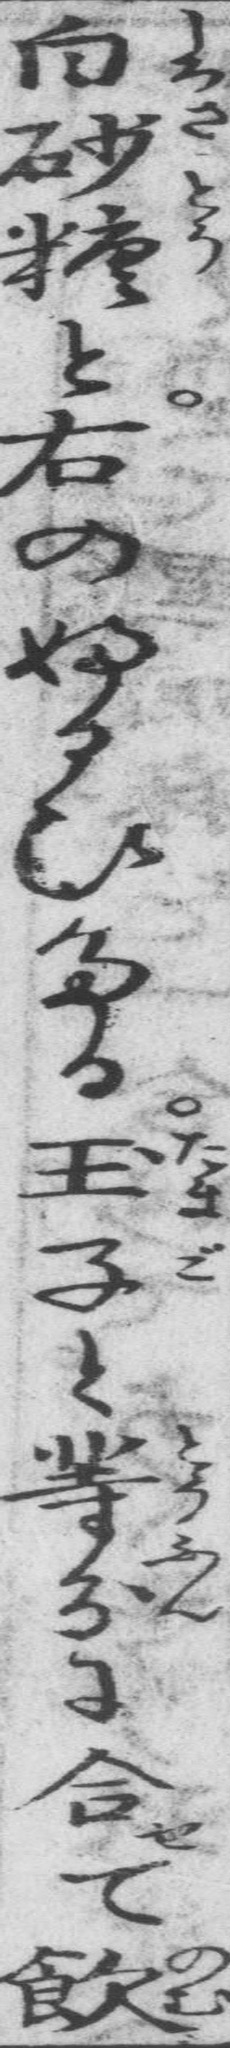白砂糖と。右のふるひたる。玉子と等分に合せて。飲
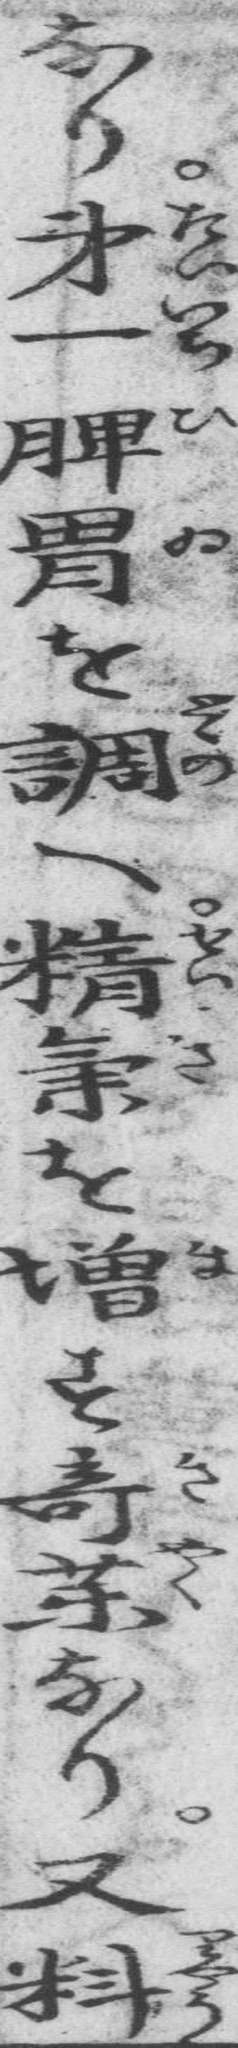なり。第一脾胃を調へ。精気を増す奇薬なり。又料
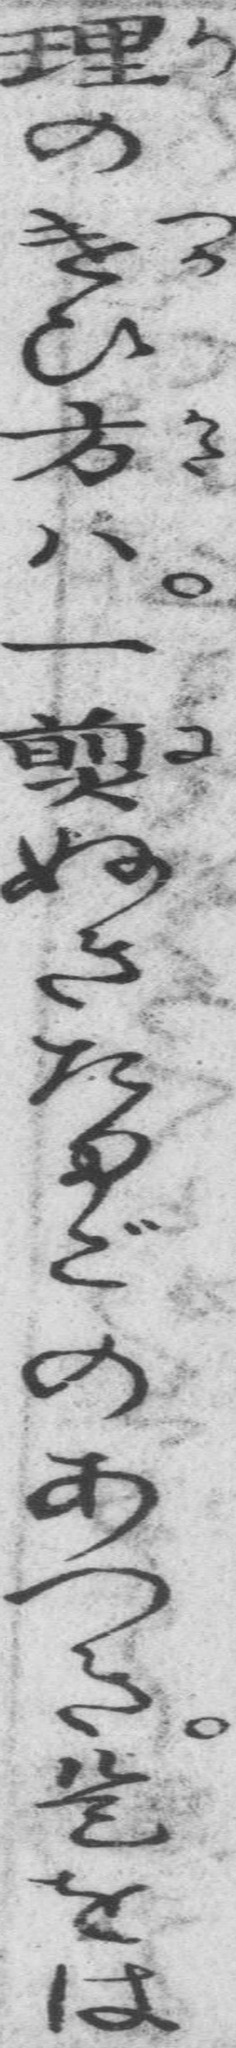理の遣ひ方は。一煎ぬきたまごのあつき。是をは
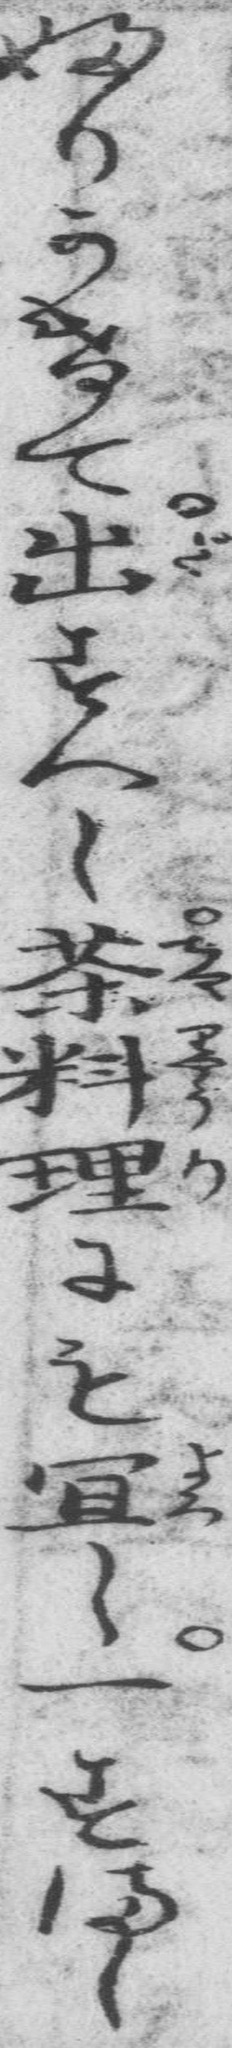ふりかけて。出すへし。茶料理にも宜し。一すまし
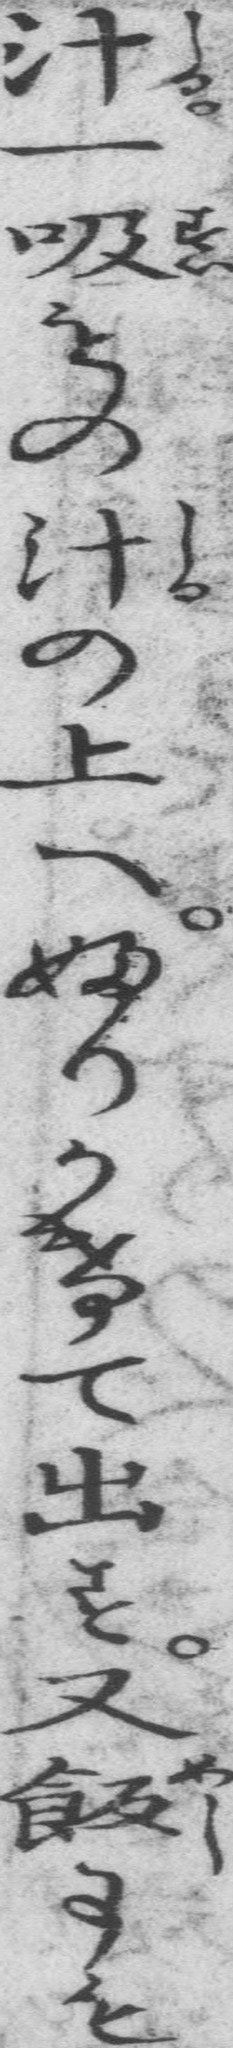汁一吸もの汁の上へ。ふりかけて出す。又飯にも
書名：萬寳料理秘密箱
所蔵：大阪府立大学学術情報センター 国文学研究資料館
